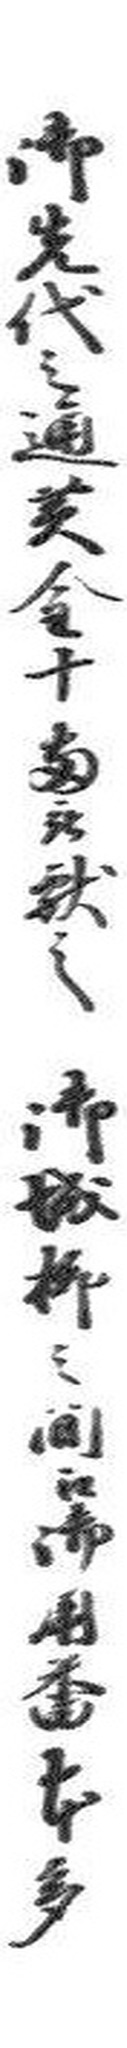御先代之通黄金十両被献之御城柳之間江御用番本多
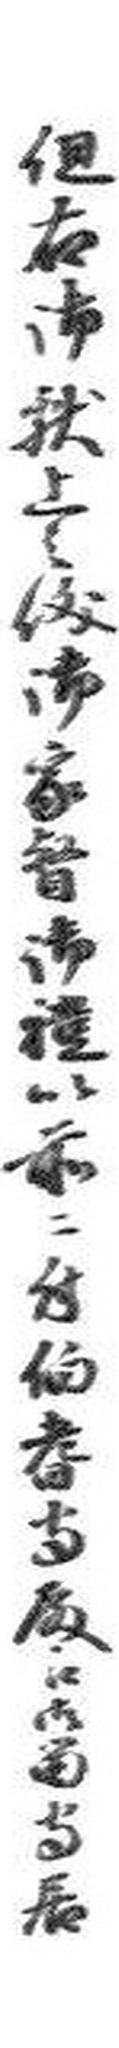但右御献上之儀御家督御礼以前ニ付伯耆守江御留守居
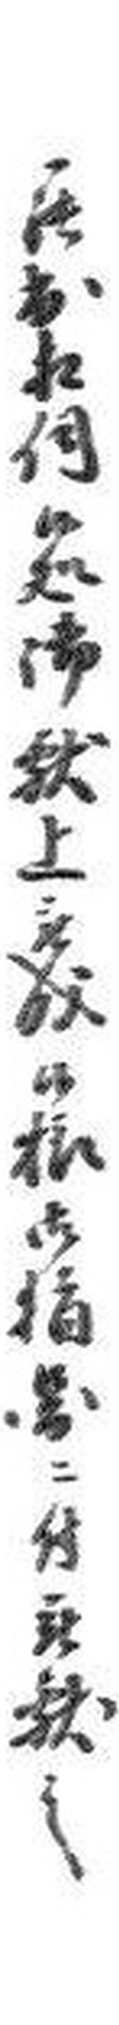罷出相伺候処御献上被成候様御指図ニ付被献之
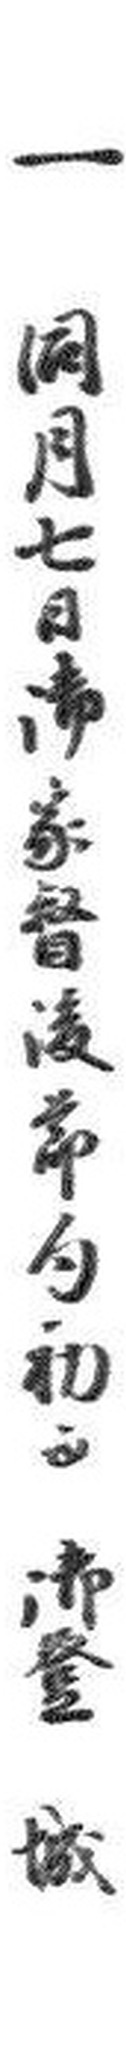一同月七日御家督後節句初而御登城
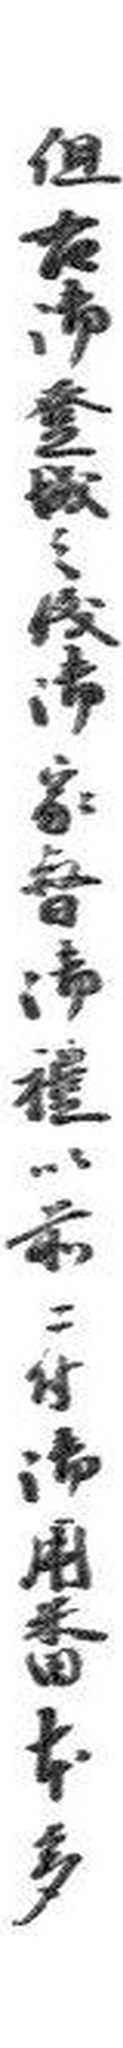但右御登城之儀御家督御礼以前ニ付御用番本多
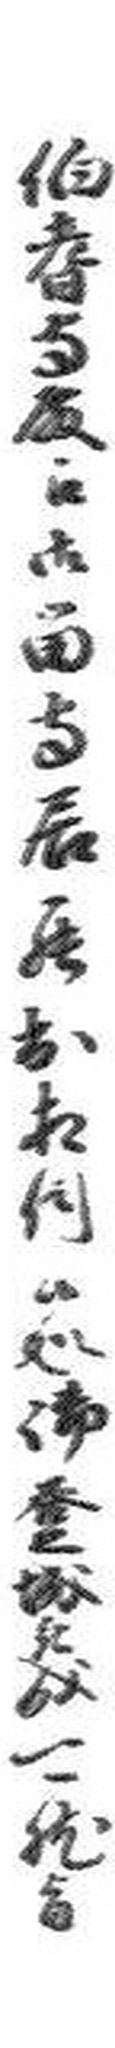伯耆守殿江御留守居罷出相伺候処御登城被成可然旨

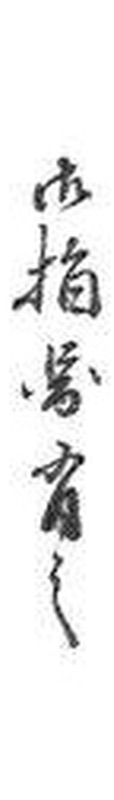御指図有之
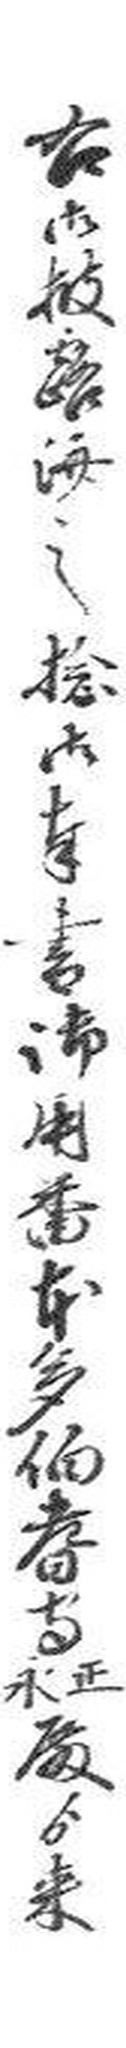右御披露済之捻御奉書御用番本多伯耆守正永殿ゟ来
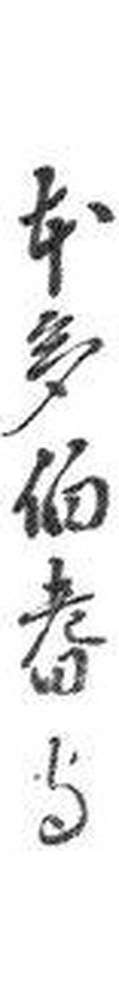本多伯耆守
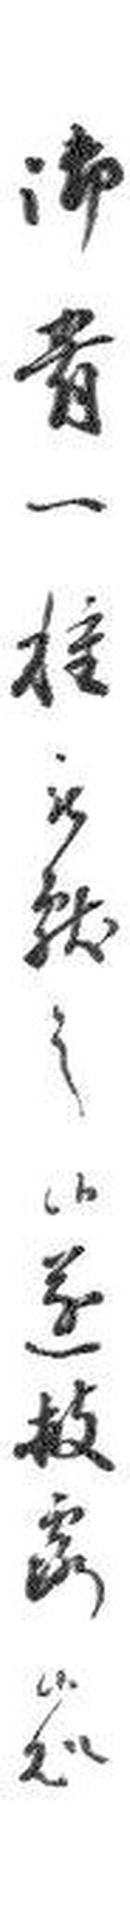御肴一種被献之候遂披露候処
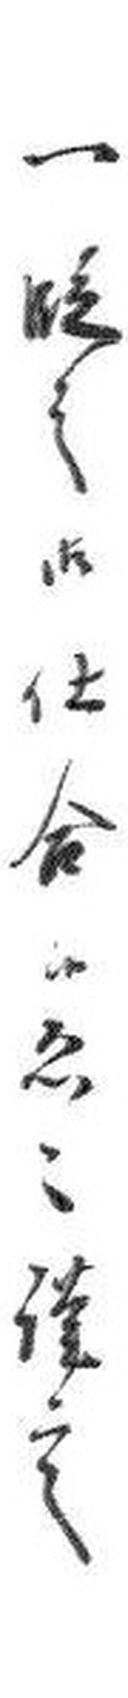一段之御仕合候恐々謹言
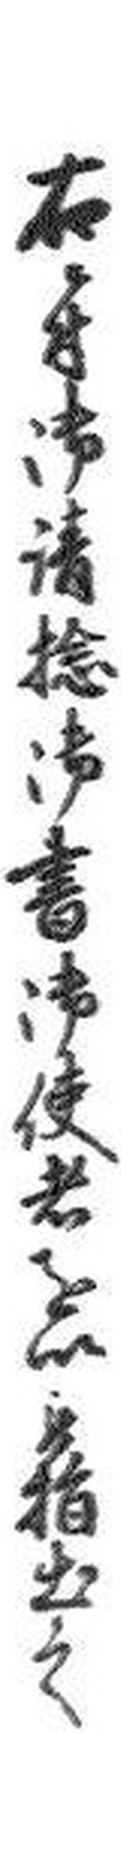右ニ付御請捻御書御使者を以被指出之
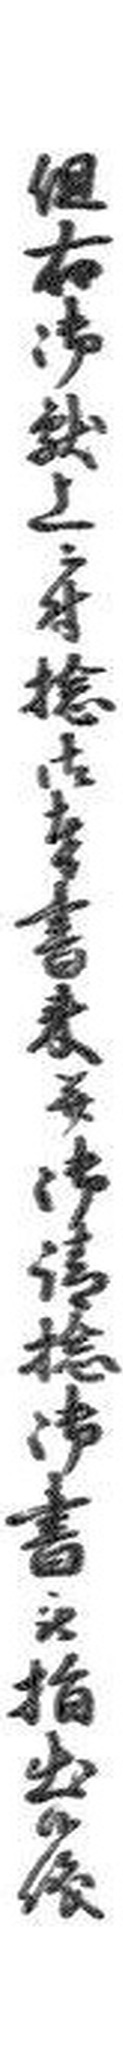但右御献上ニ付捻御奉書来并御請捻御書被指出候儀
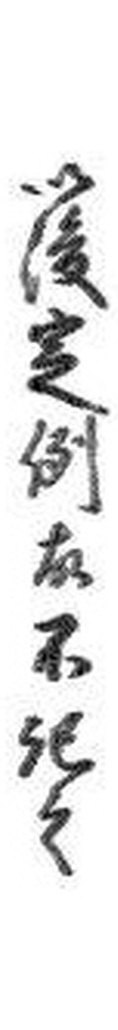以後定例故不記之
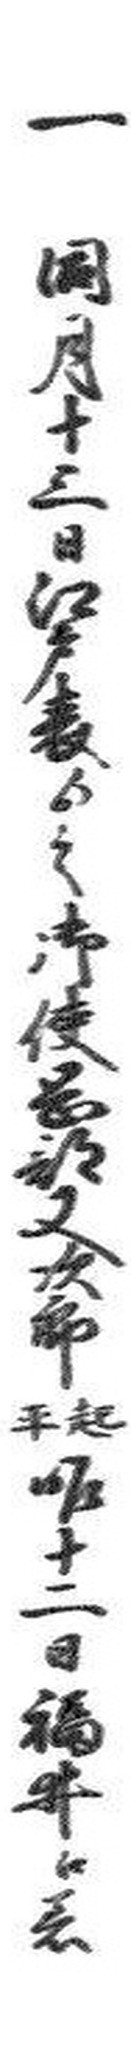一同月十三日江戸表ゟ之御使岡部又次郎起平昨十二日福井江着
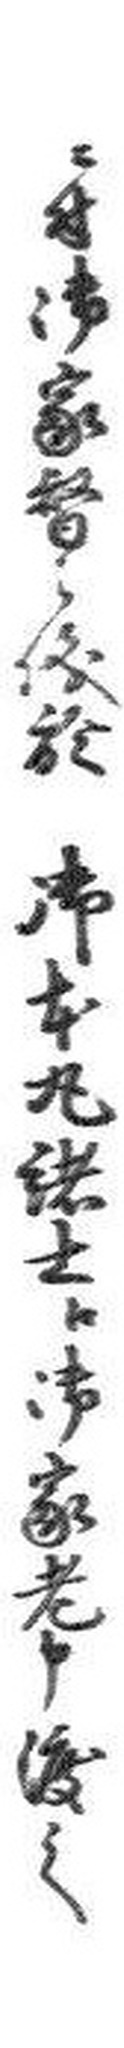ニ付御家督之儀於御本丸諸士江御家老申渡之
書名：家譜 二十八 吉邦公 従宝永七年七月五日到正徳元年十二月
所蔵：福井県文書館 Fukui Prefectural Archives
